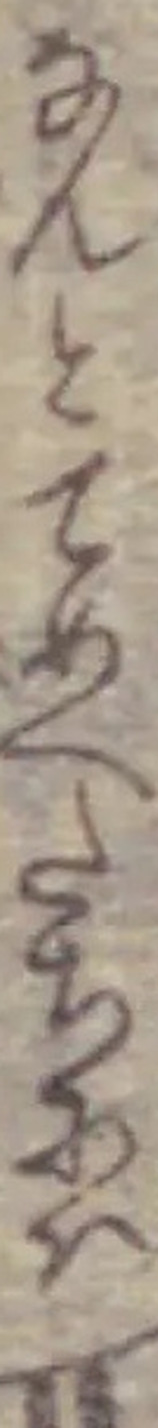なんとてめへたちには
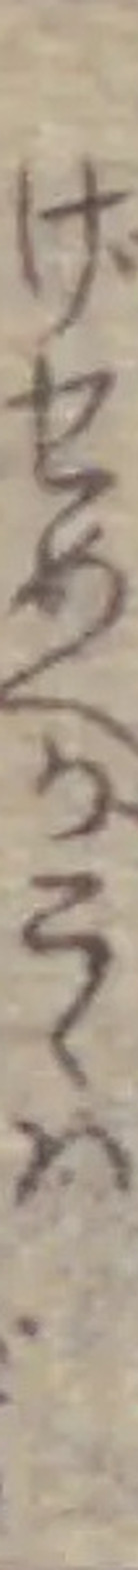げせめへがこゝは
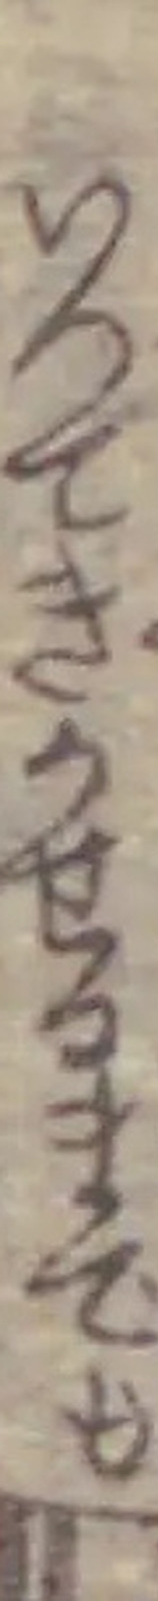いつてきかせるまでも
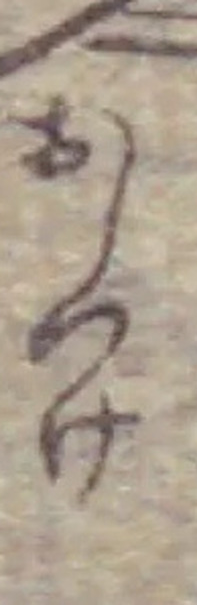おしつけ
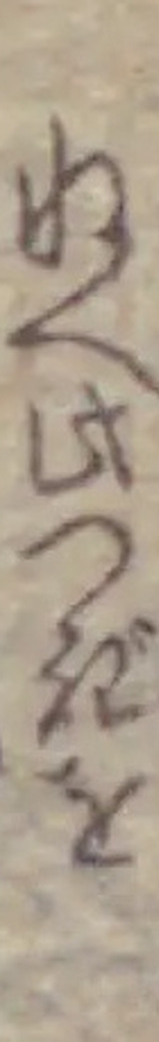ねへ此つぎを
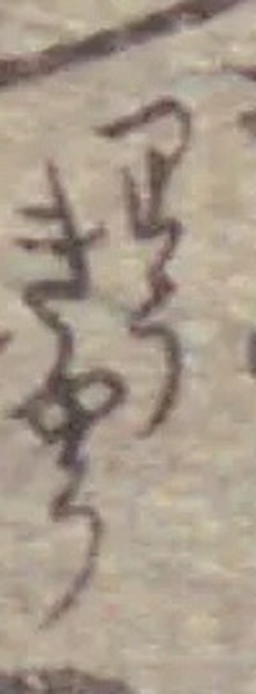きやう
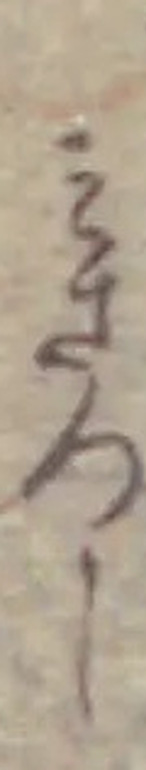みさつし
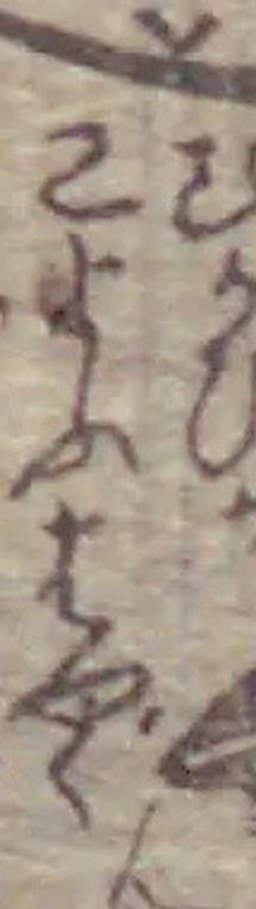こよふはやく
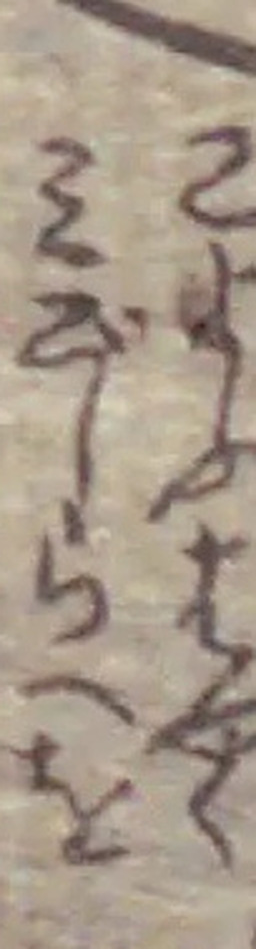みごしらへを
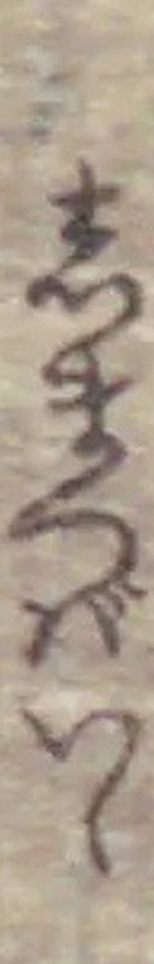しまへばいゝ
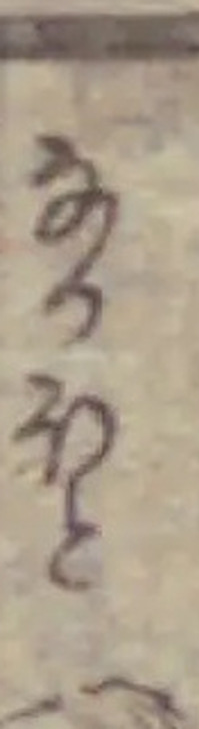なるほと

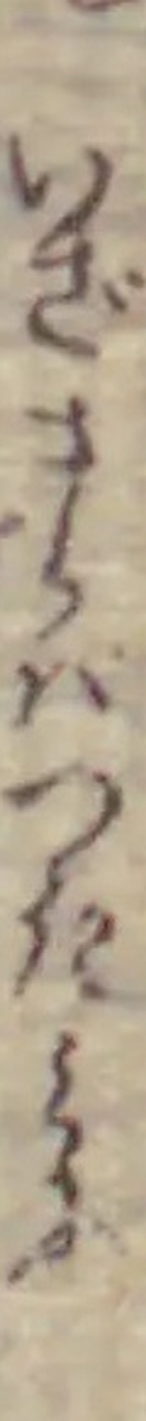いざさらはつきみに
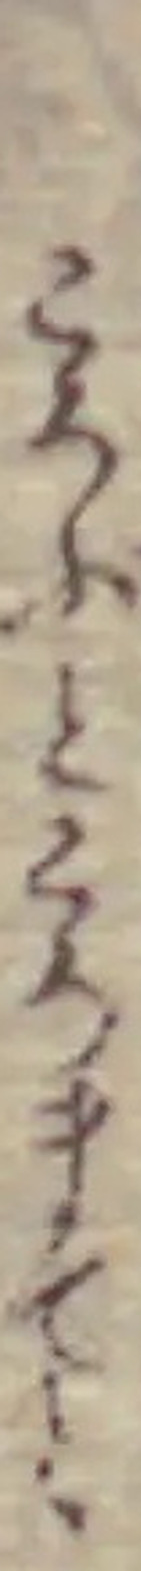ころぶところまてと
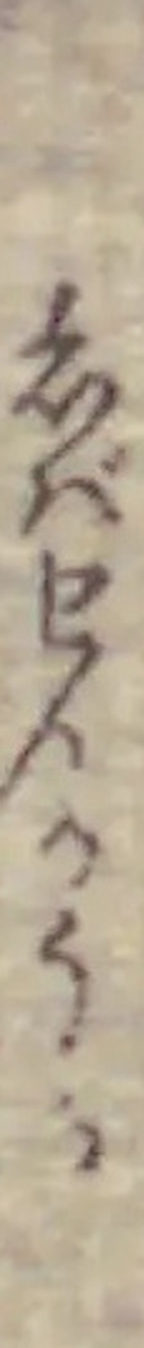しばせんかうが
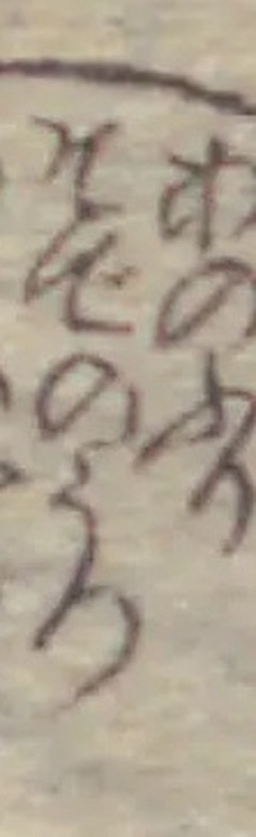そでのうつ
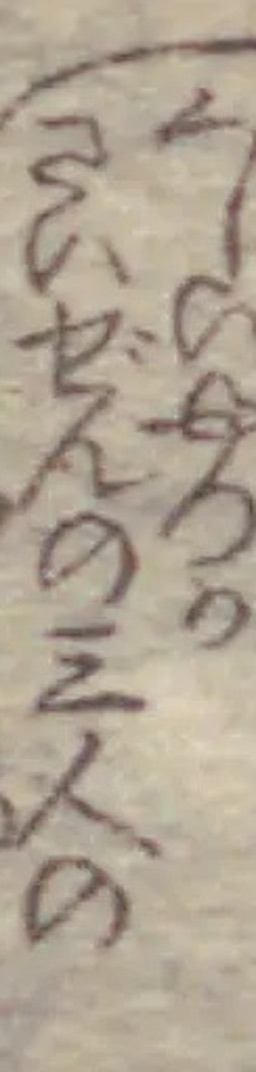さいぜんの三人の
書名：化物大閉口 2巻
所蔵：国立国会図書館 National Diet Library, JAPAN
